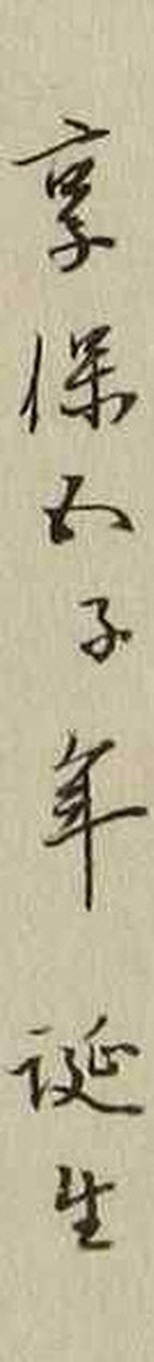享保五子年誕生
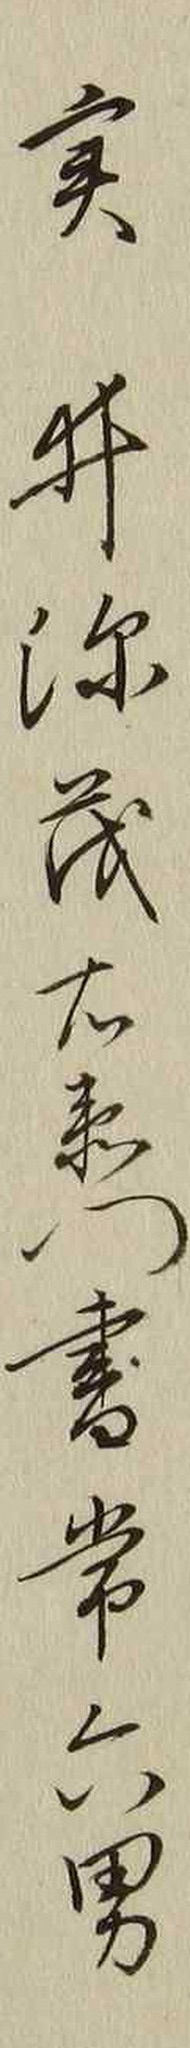実井深茂右衛門書常六男
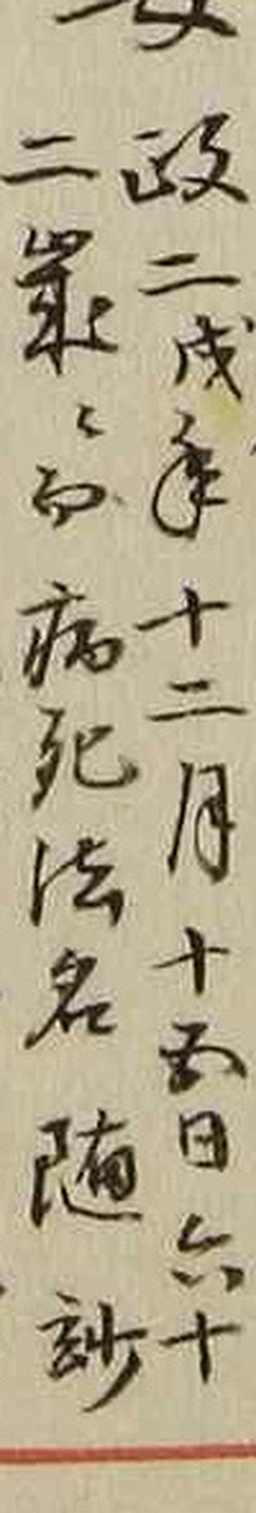二歳ニ而病死法名随玅
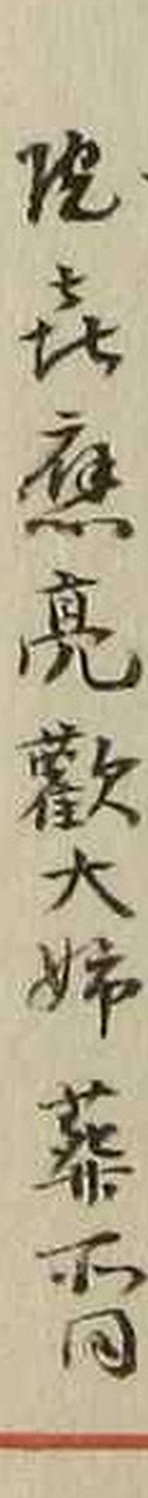院喜応亮歓大姉葬所同
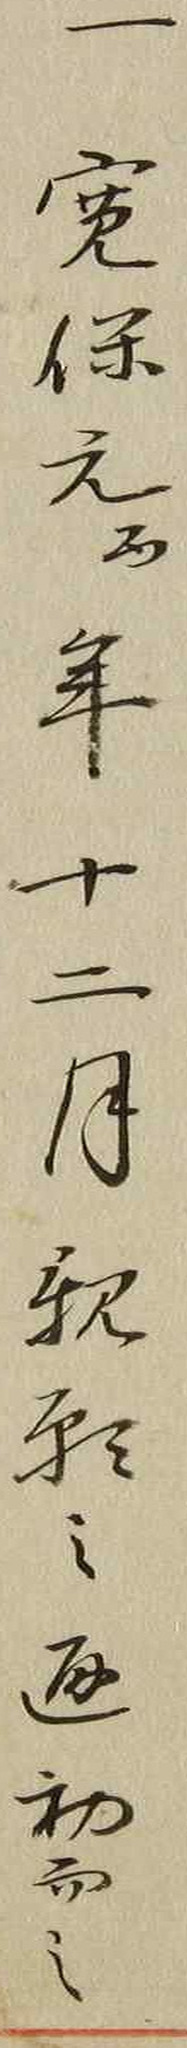一寛保元酉年十二月親願之通初而之
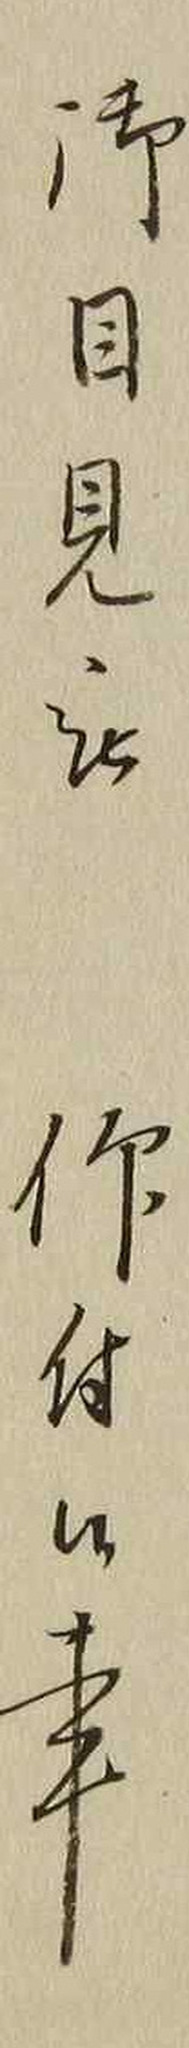御目見被仰付候事
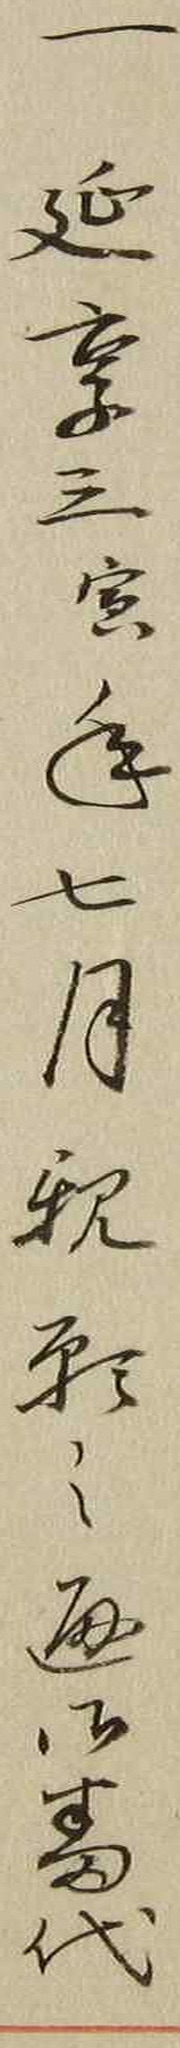一延享三寅年七月親願之通御番代
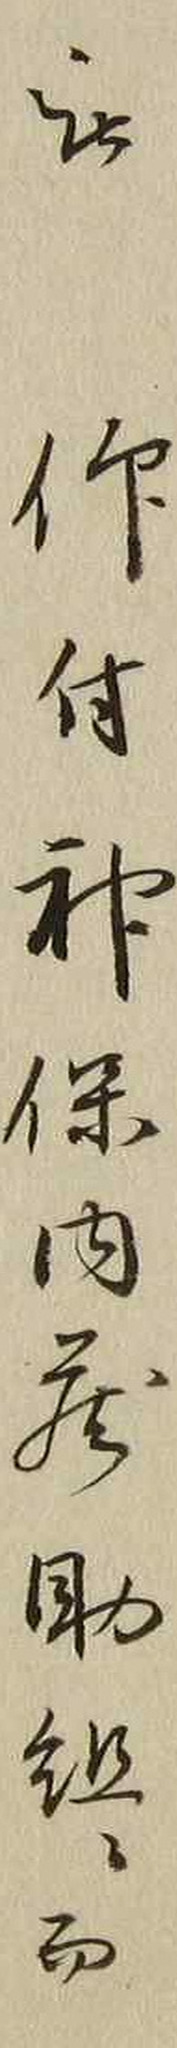被仰付神保内蔵助組ニ而
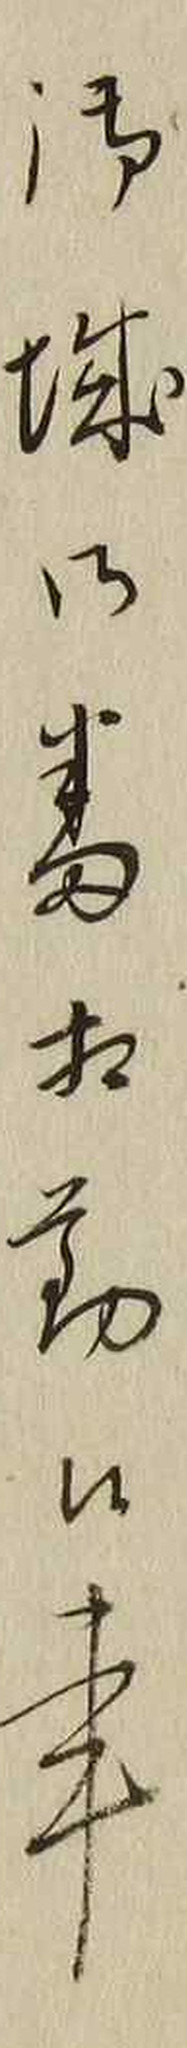御城御番相勤候事
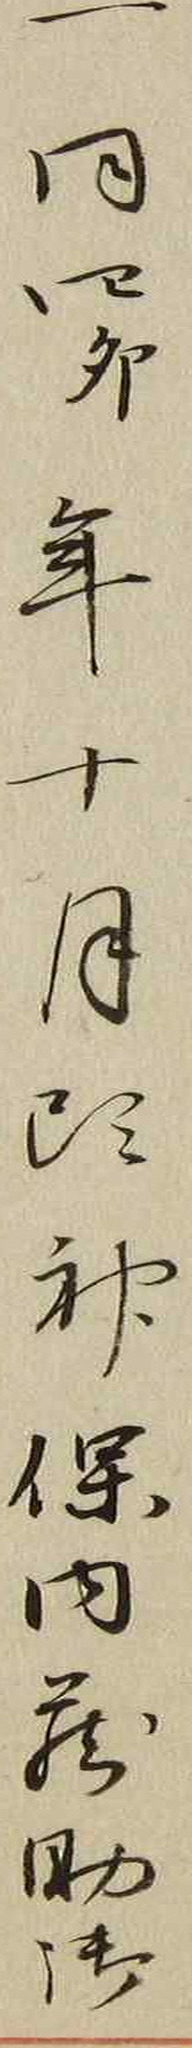一同四卯年十月頭神保内蔵助御
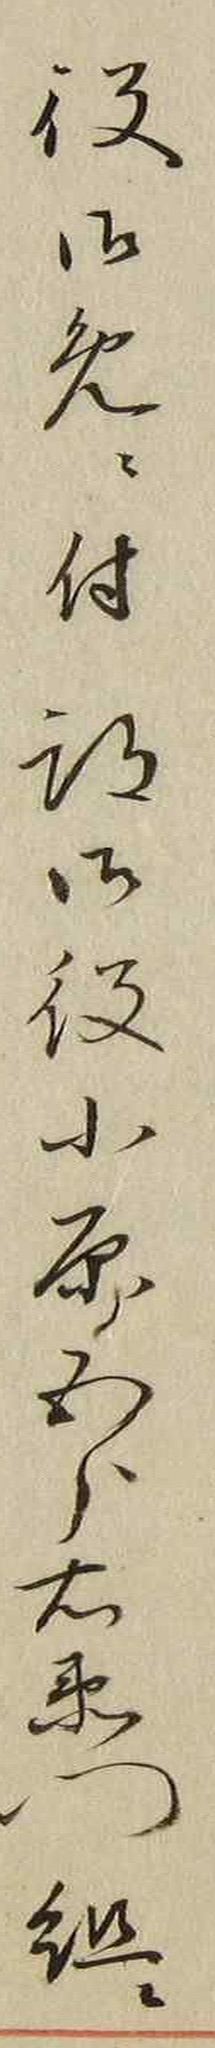役御免ニ付跡御役小原五郎右衛門組ニ
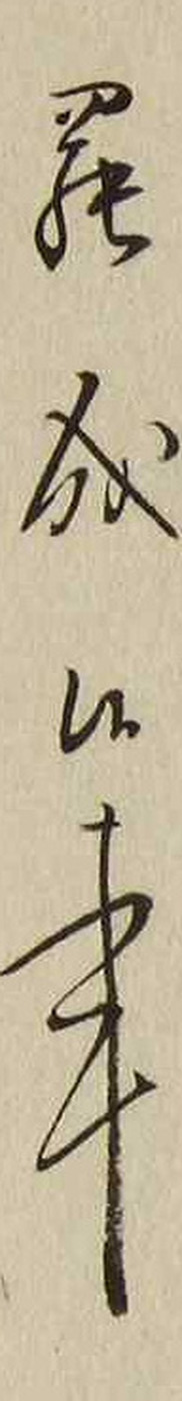罷成候事
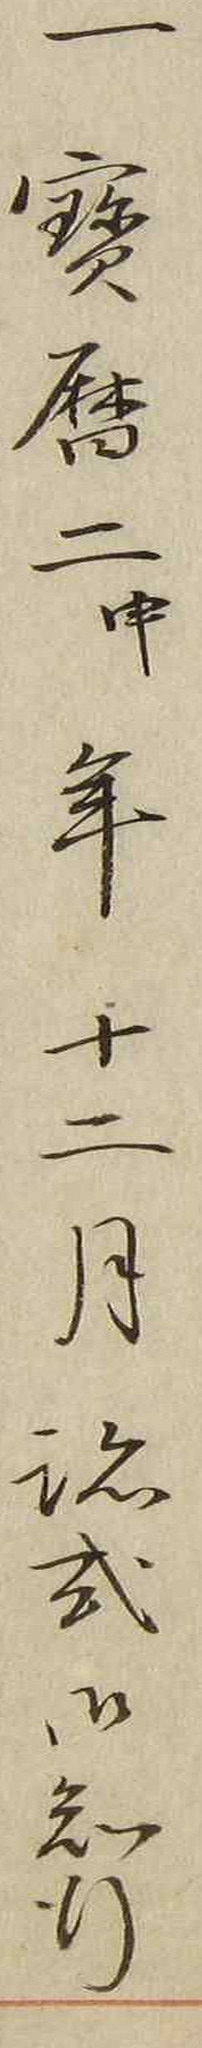一宝暦二申年十二月跡式御知行

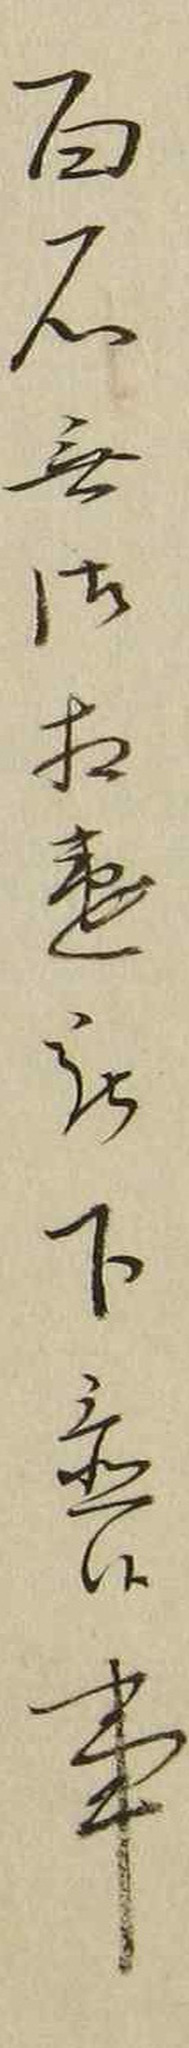百石無御相違被下置候事
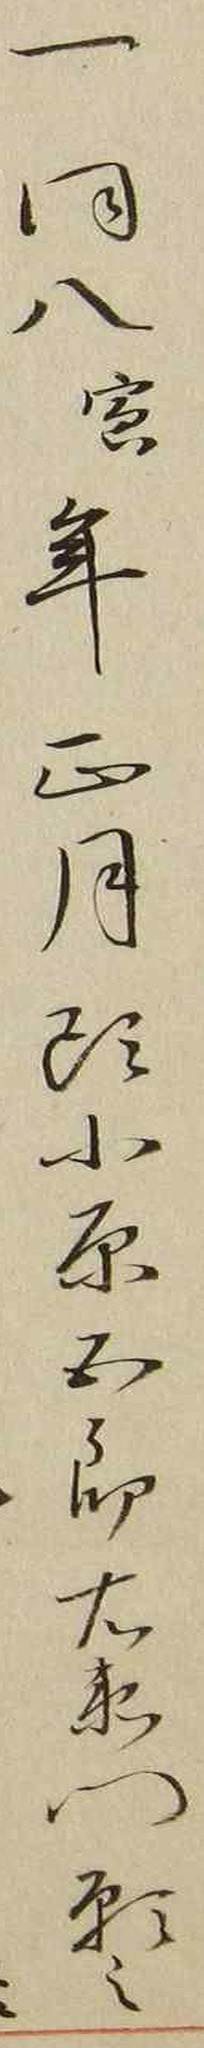一同八寅年正月頭小原五郎右衛門願之
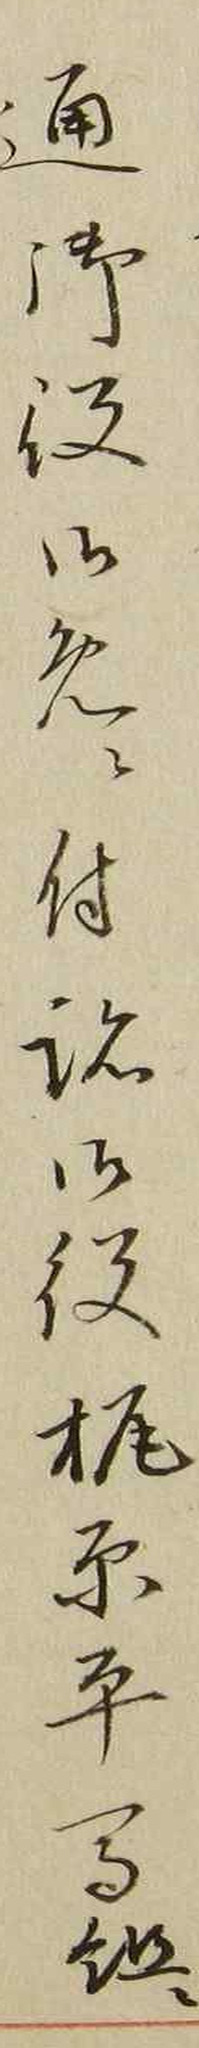通御役御免ニ付跡御役梶原平馬組ニ
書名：諸士系譜　巻之22　い之部22
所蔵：会津若松市立会津図書館
